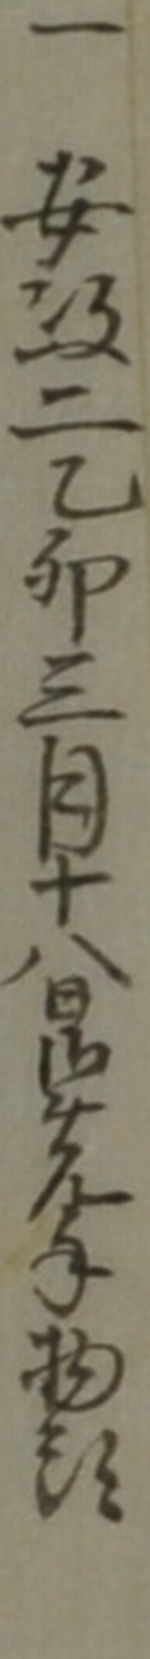一安政二乙卯三月十八日御先手物頭
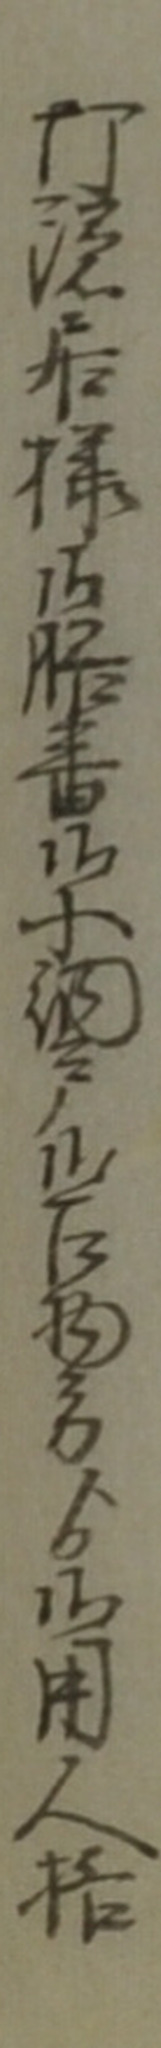御隠居様御膳番御小納戸御召物方ゟ御用人格
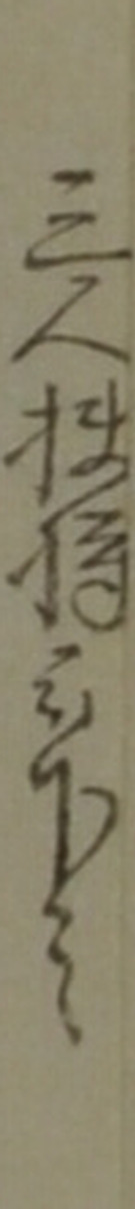三人扶持被下之
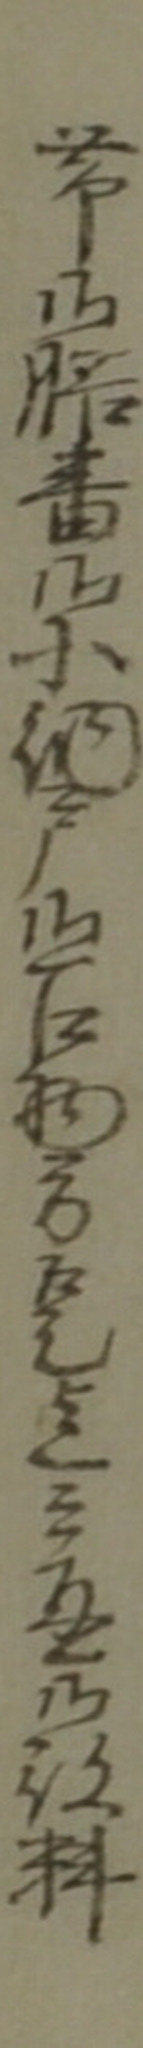帯御膳番御小納戸御召物方是迄之通御役料
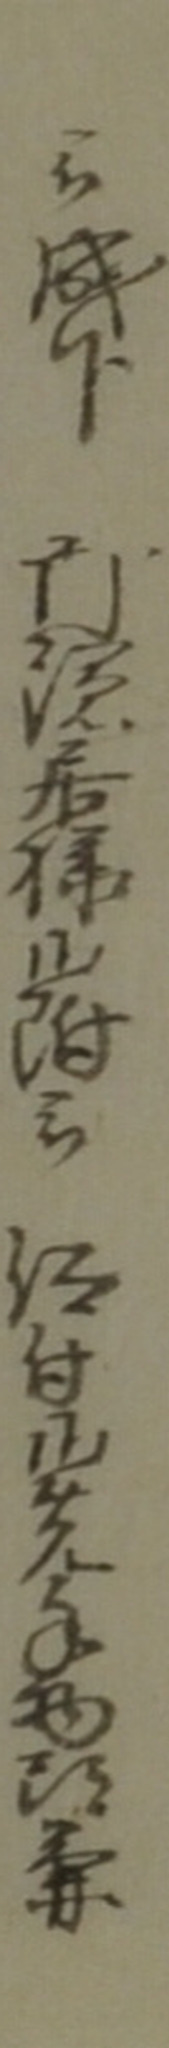被成下御隠居様御附被仰付御先手物頭兼
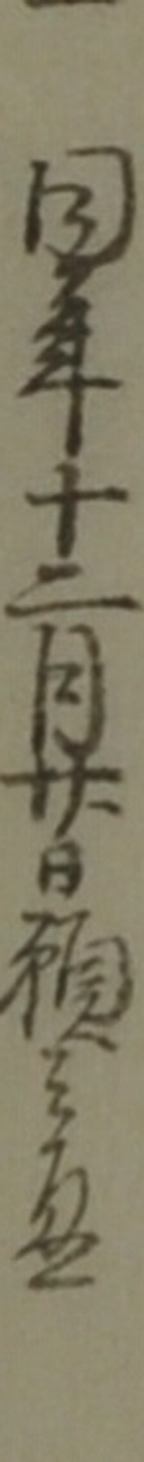一同年十二月廿日願之通
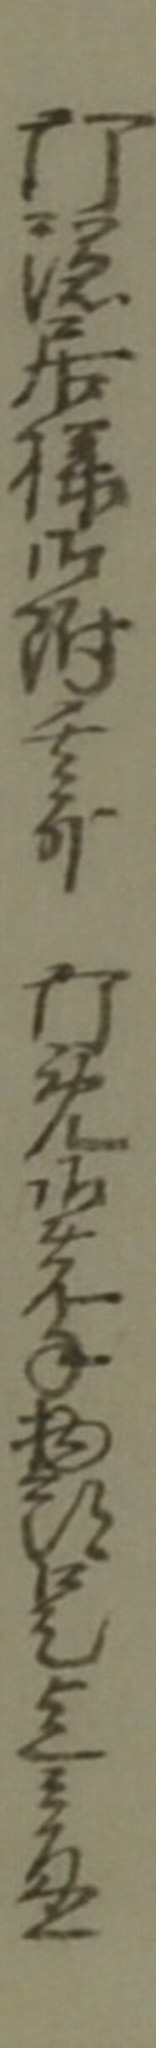御隠居様御附其外御免御先手物頭是迄之通

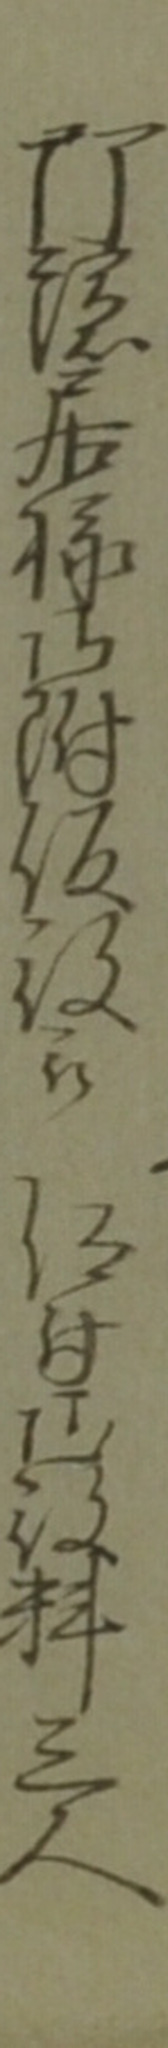御隠居様御附仮役被仰付御役料三人
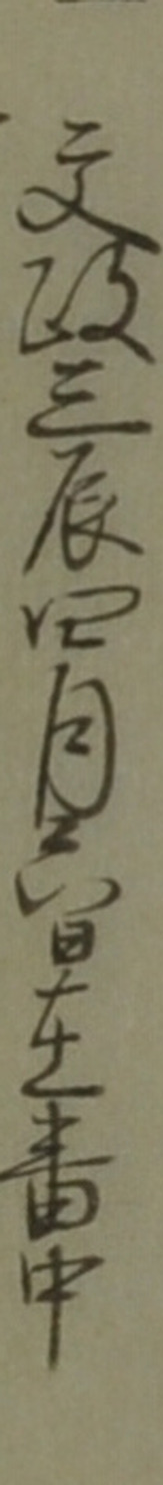一文政三辰四月六日在番中
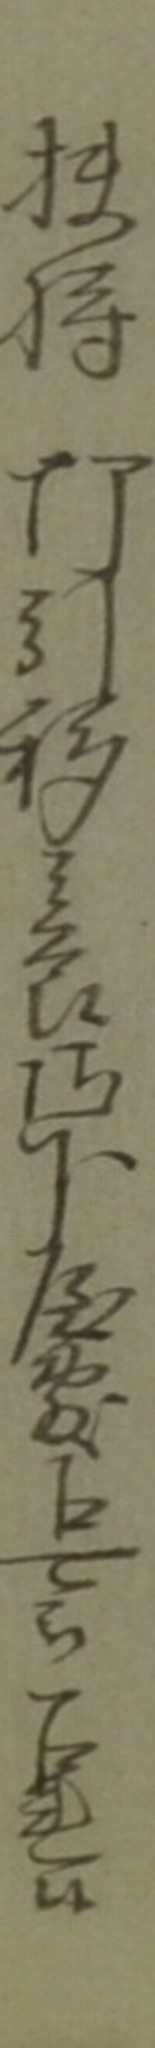扶持御引移之節御下屋敷迄被召連候
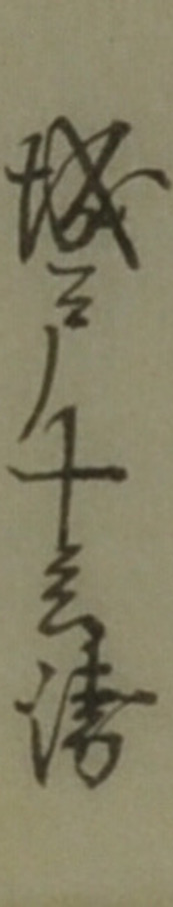城戸十兵衛
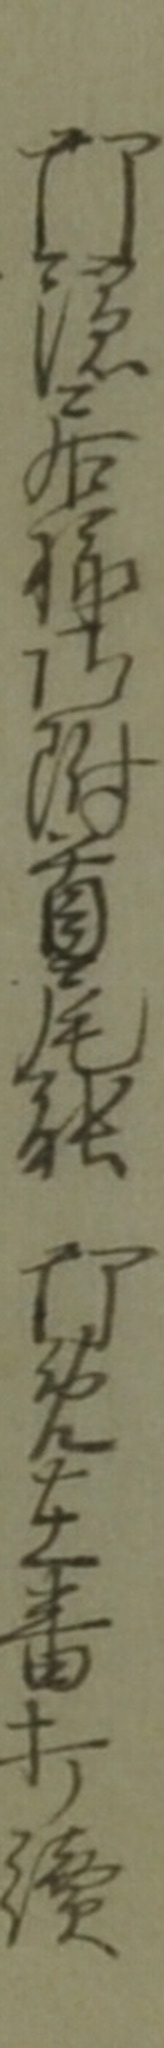御隠居様御附首尾能御免在番打続
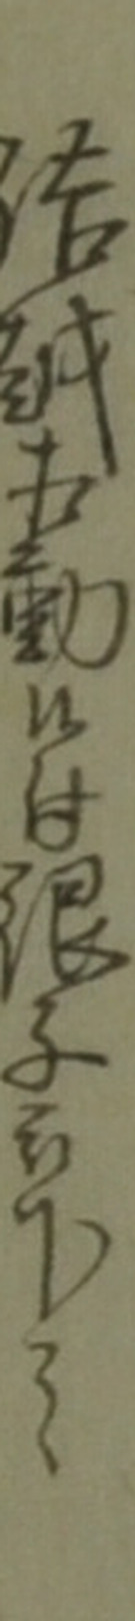詰越相勤候付銀子被下之
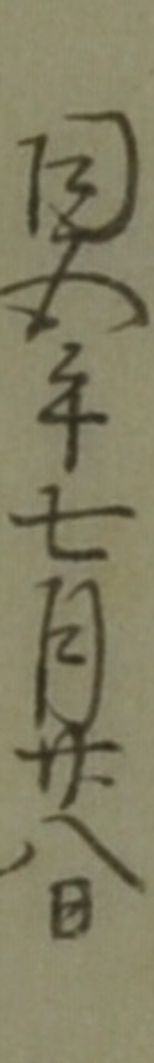一同五午七月廿八日

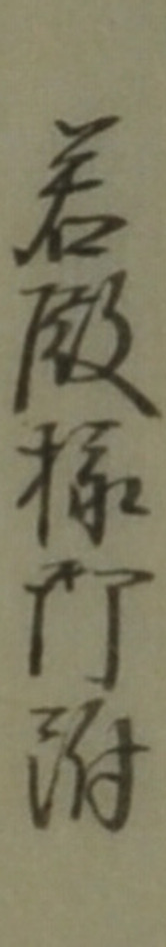若殿様御附
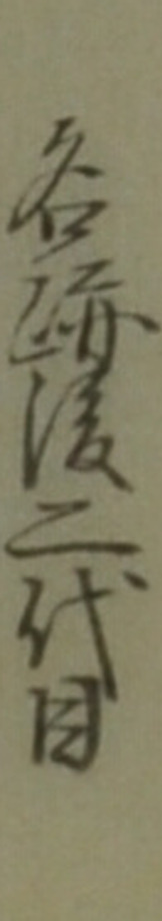名跡後二代目
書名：諸御役代々録（二）
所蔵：伊那市立高遠町図書館・合同会社AMANE
